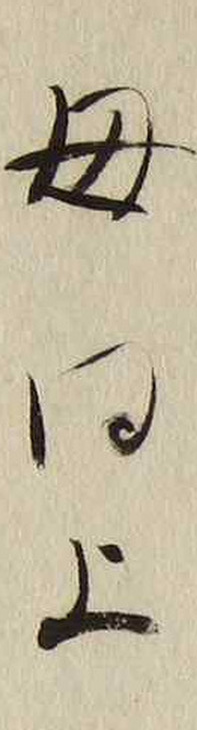母同上

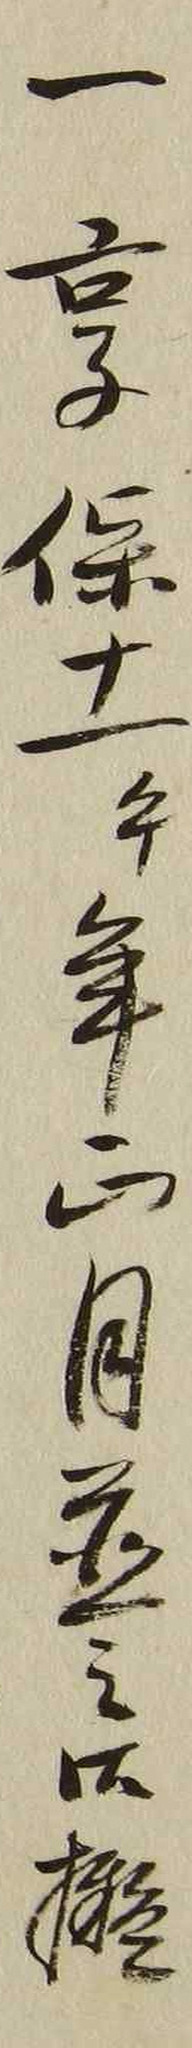一享保十一午年正月並之御擬
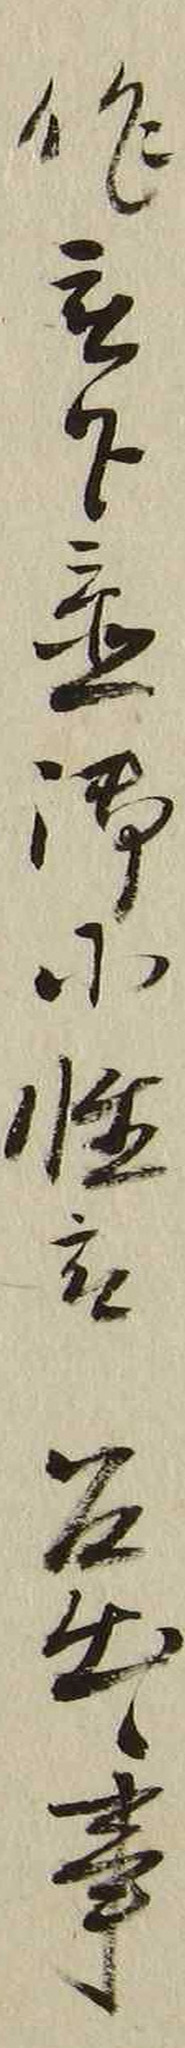作被下置御小性被召出候事
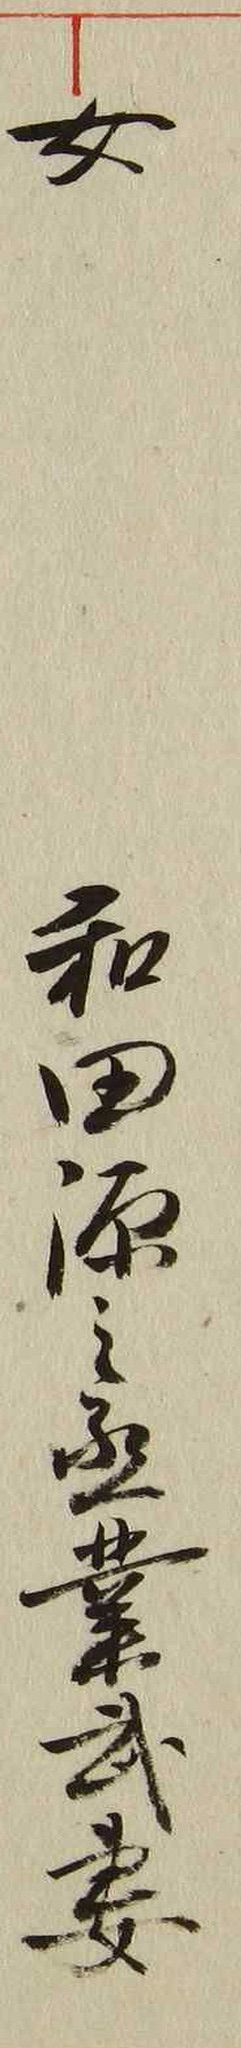女和田源之丞業武妻
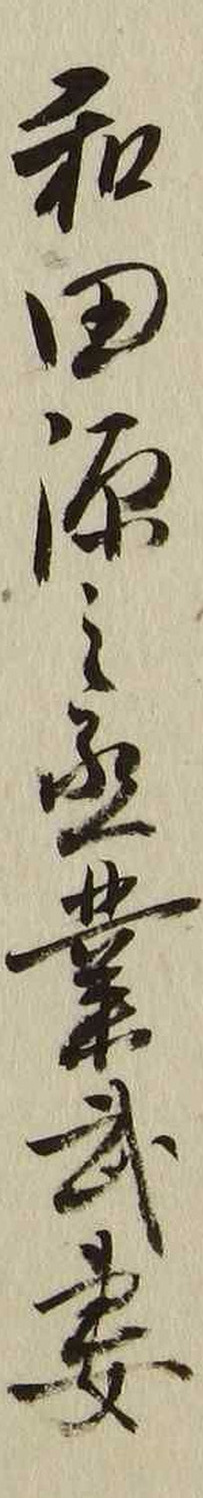女和田源之丞業武妻
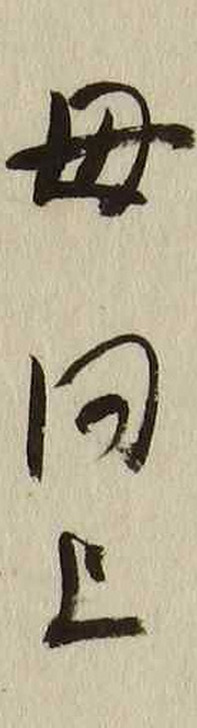母同上
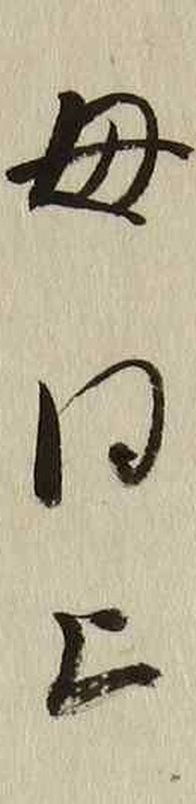母同上
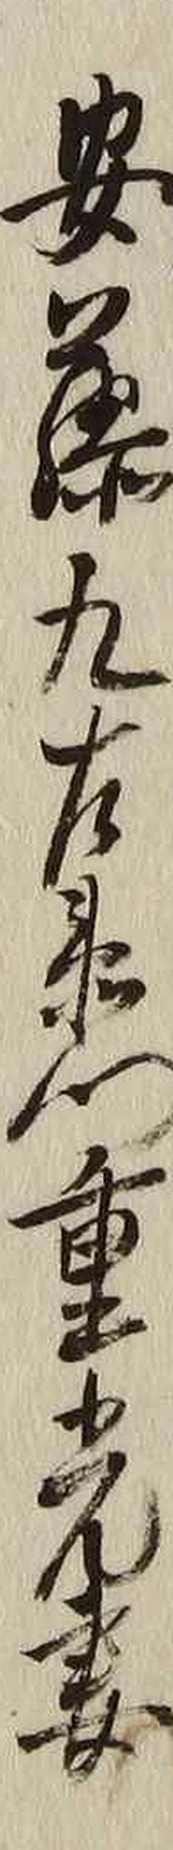安藤九左衛門重光妻
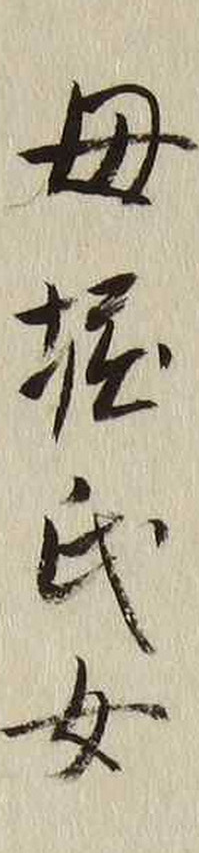母堀氏女
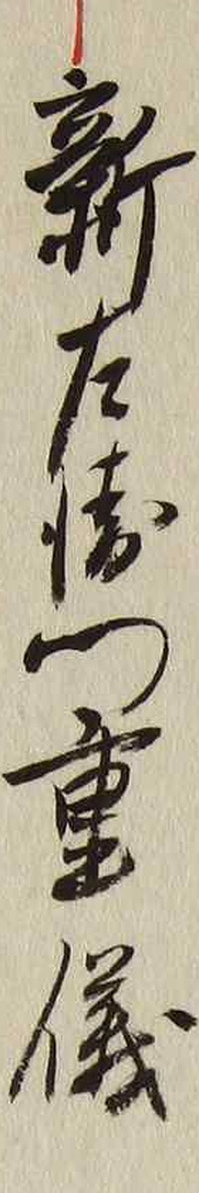新左衛門重儀
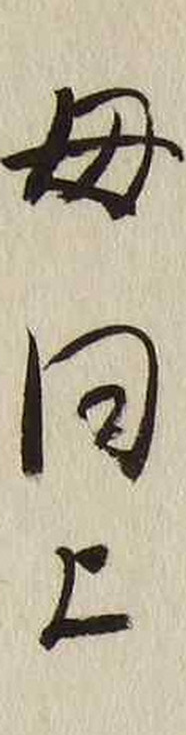母同上
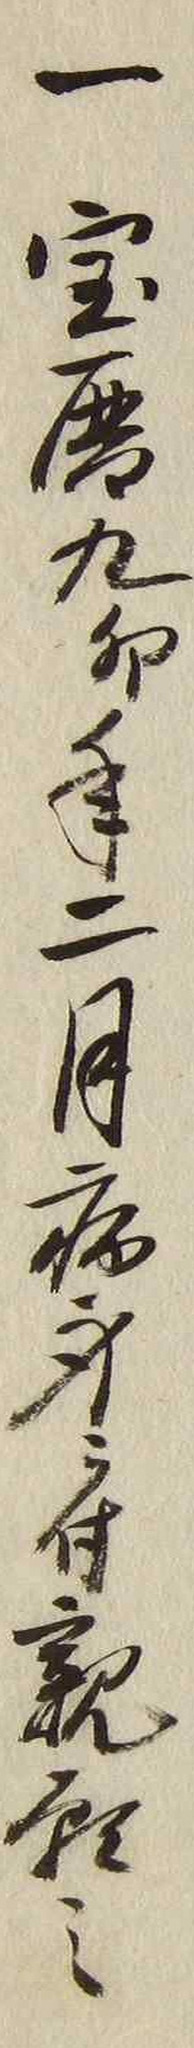一宝暦九卯年二月病身ニ付親願之

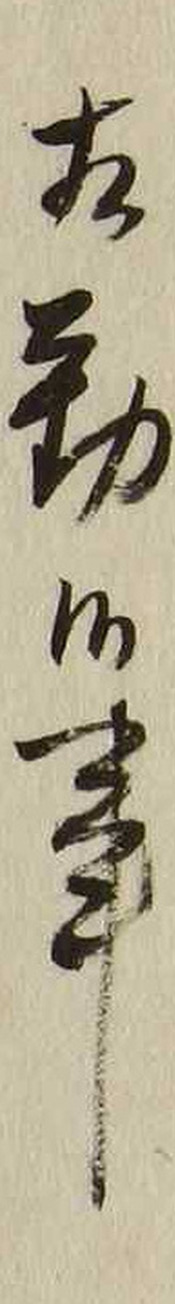相勤候事
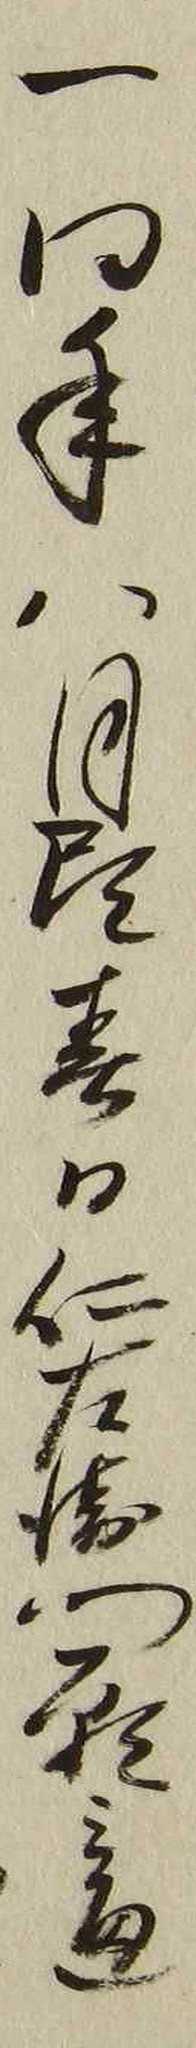一同年八月頭春日仁左衛門願之通
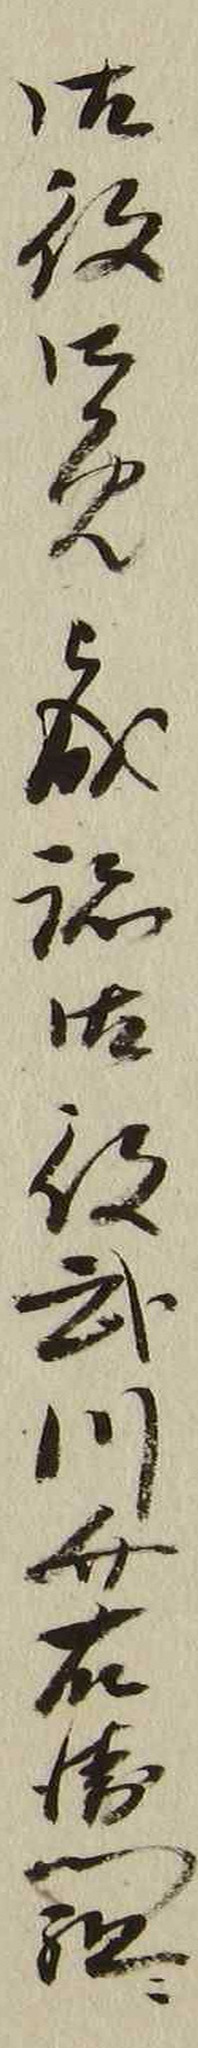御役御免被成跡御役武川介右衛門組ニ
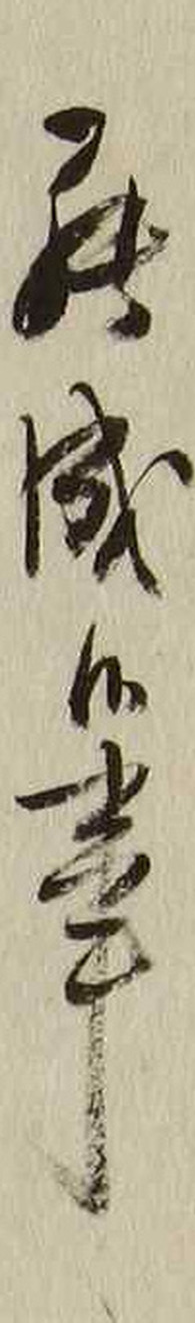罷成候事
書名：諸士系譜　巻之355　す之部5
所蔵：会津若松市立会津図書館
